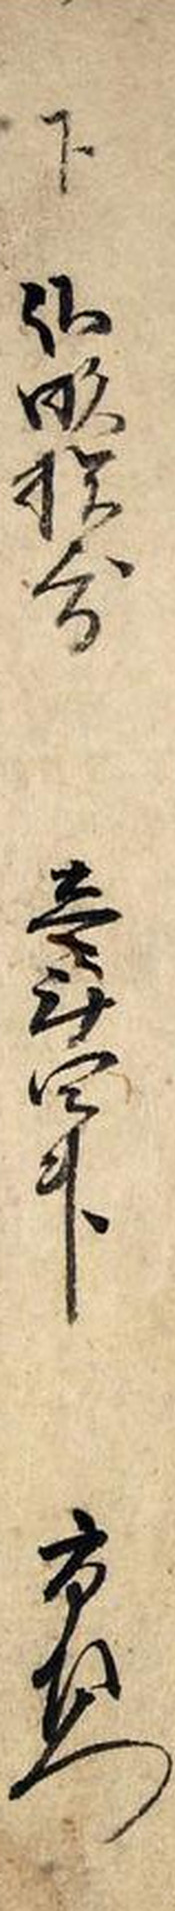下弐畝拾歩壱斗四升市左衛門
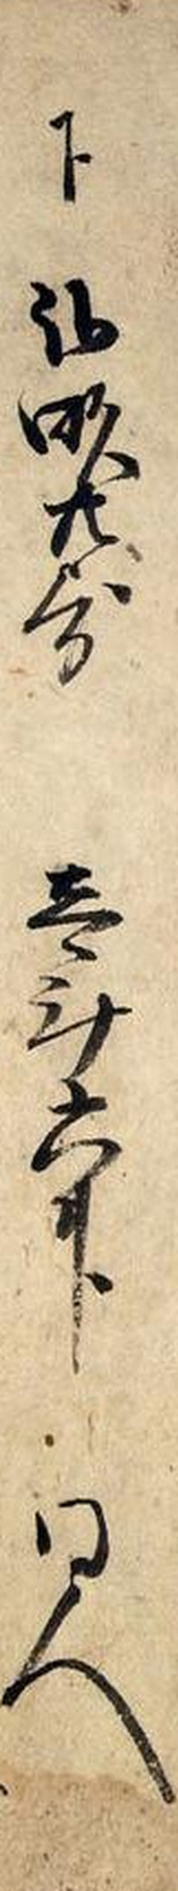下弐畝廿歩壱斗六升同人
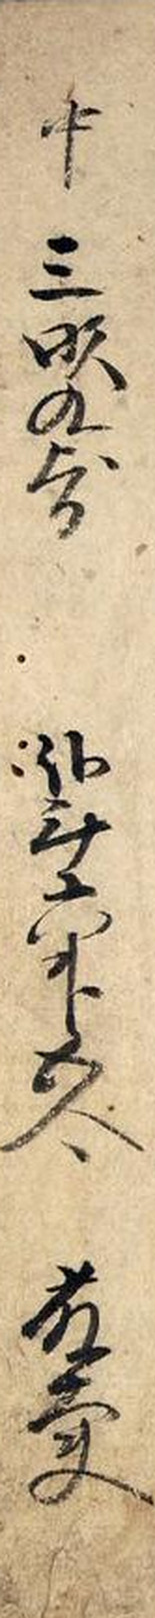中三畝九歩弐斗六升五合藤大夫

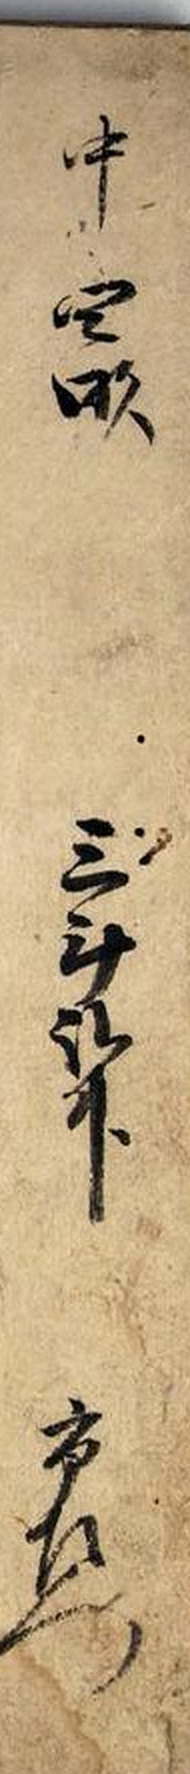中四畝三斗弐升市左衛門
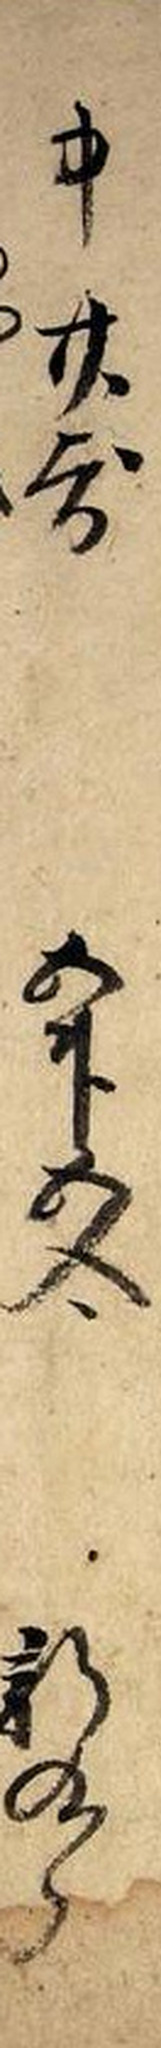中廿歩五升五合新九郎
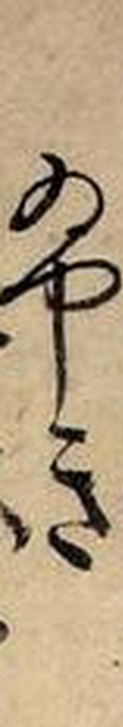ゐやしき
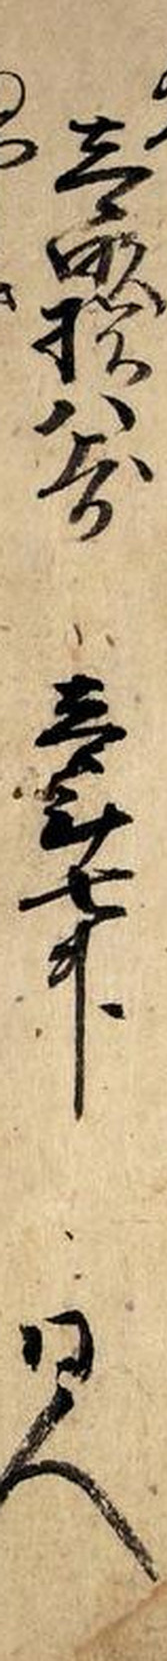壱畝拾八歩壱斗七升同人
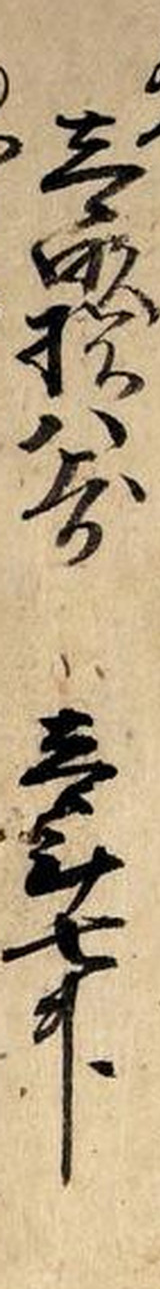壱畝拾八歩壱斗七升同人
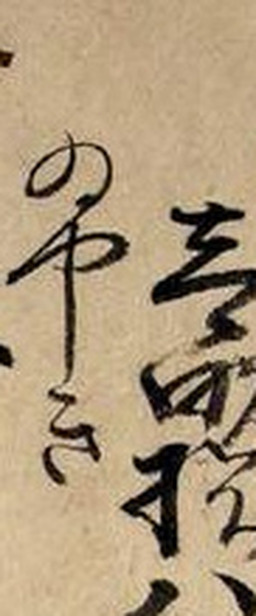ゐやしき
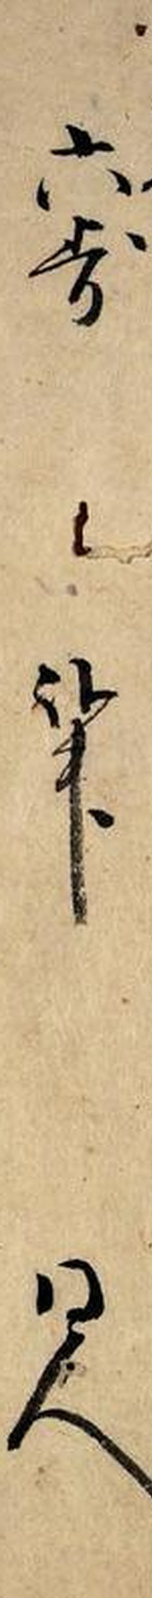六歩弐升同人
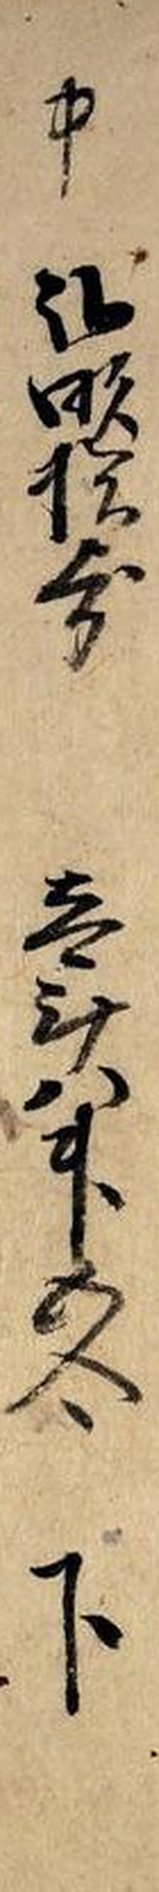中弐畝拾歩壱斗八升五合下
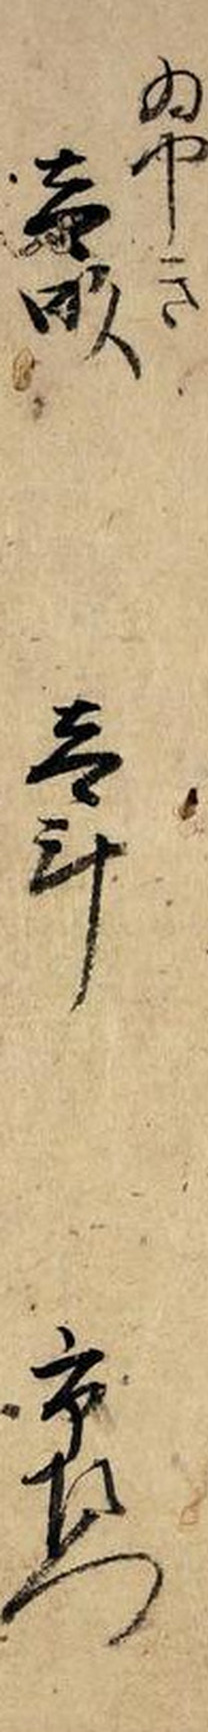壱畝壱斗市左衛門
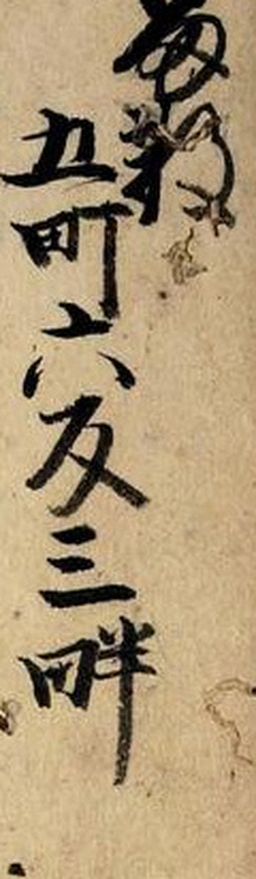五町六反三畔
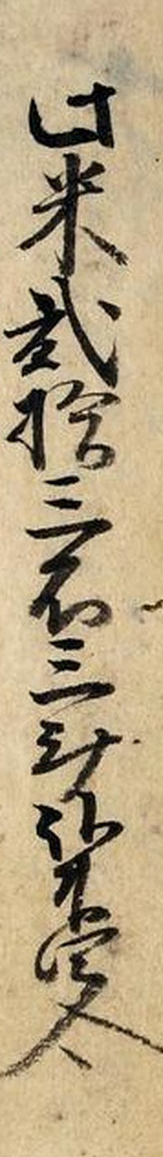此米弐拾三石三斗弐升四合
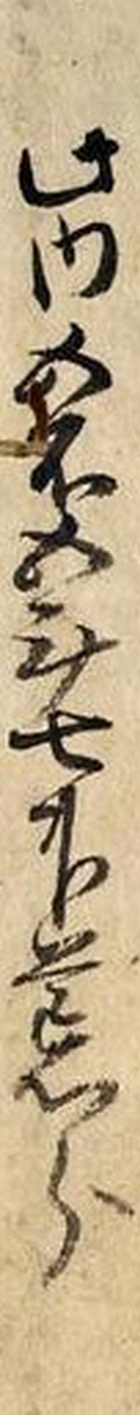此内五石五斗七升荒分
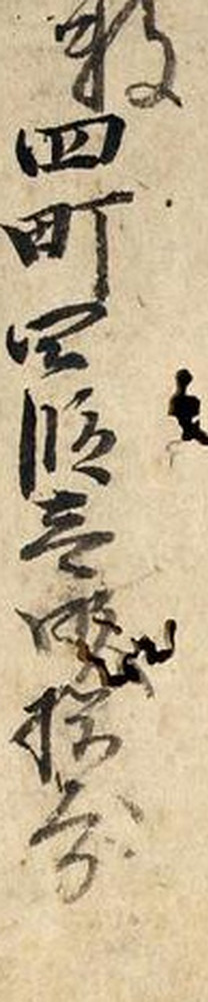四町四段壱畝拾歩
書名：若州三方郡之内世久見浦御検地帳（世久見浦検地帳写）
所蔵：福井県文書館 Fukui Prefectural Archives
